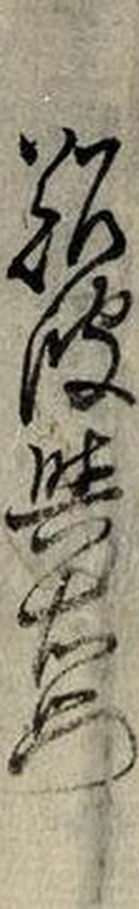難波与右衛門
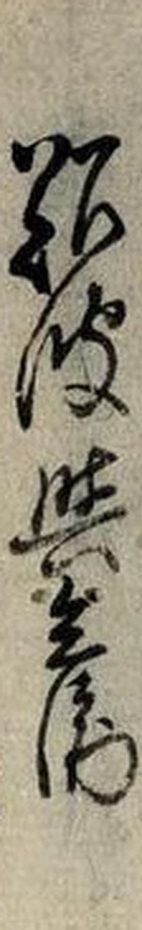難波与兵衛
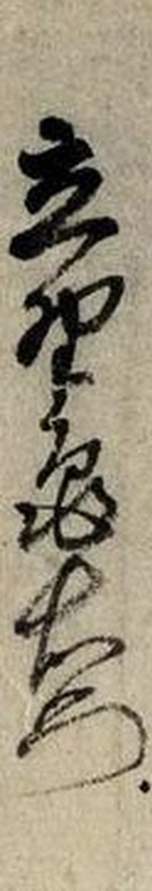立野亀右衛門

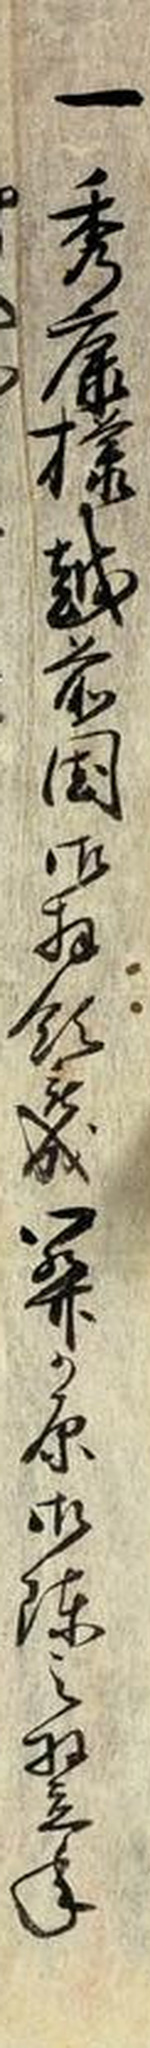一秀康様越前国御拝領被成関か原御陣之翌年
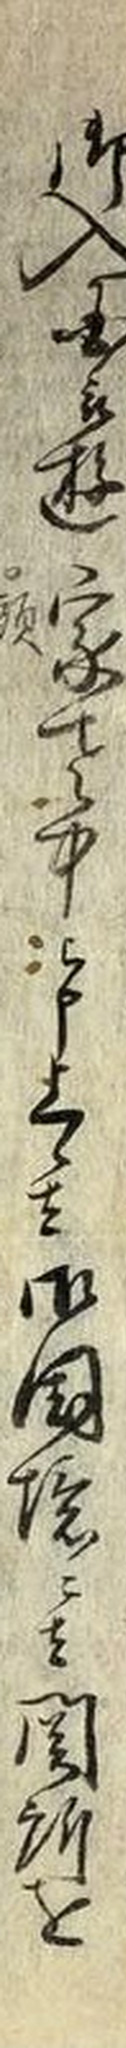御入国被遊家士之中被申上候者御国境ニ者関所を
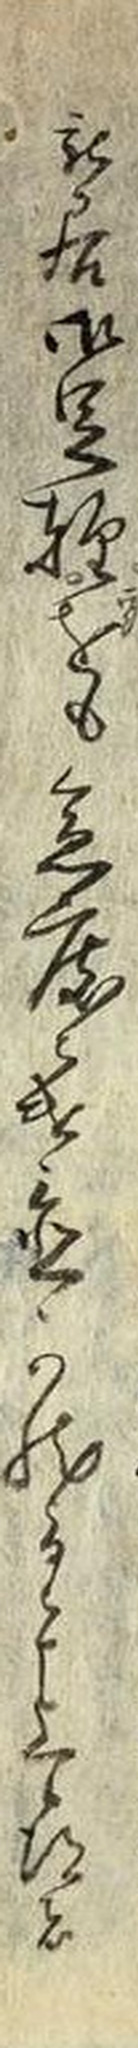被居御足軽頭をも急度被遣置可然旨被申上候得者
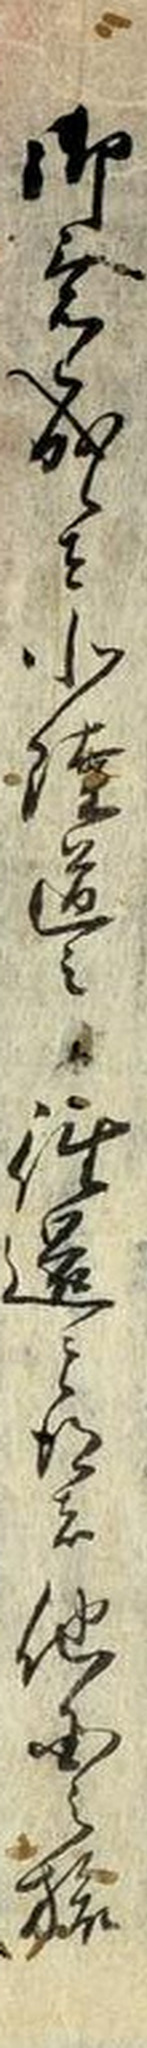御意被成候者北陸道之往還ニ候得者他国之旅
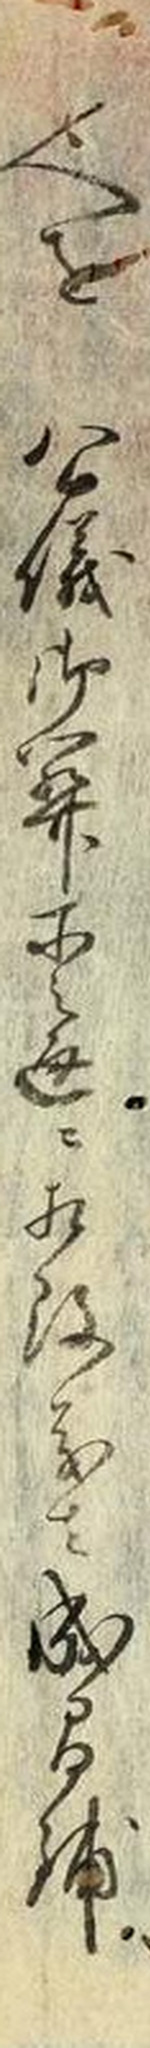人を公儀御関所之通ニ相改義者成間鋪
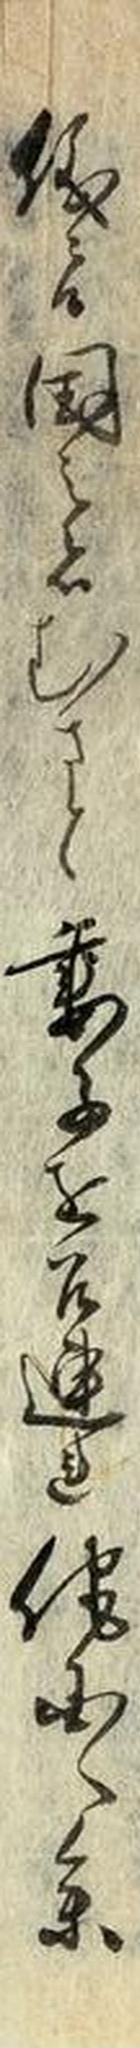儀ニ候国之者むさと妻子を召連れ他国へ参
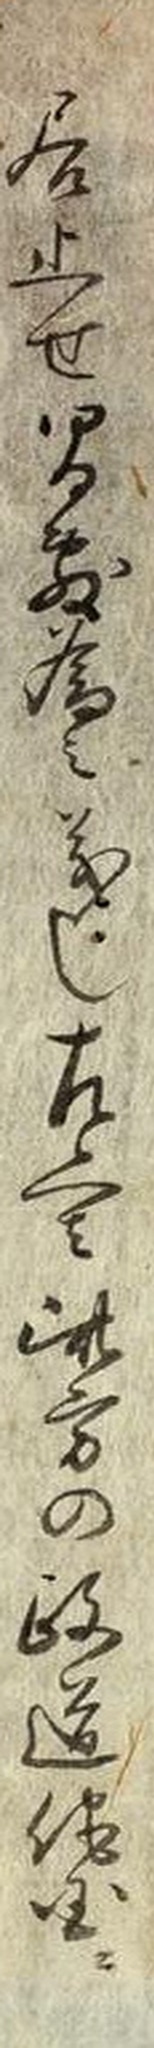居止せ間敷為之義也左候へ者此方の政道他国ニ
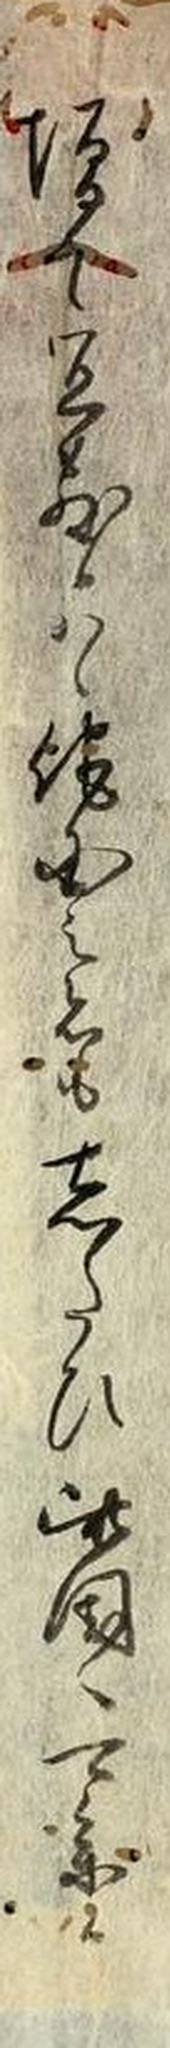増て宜敷候ハヽ他国之者もしたひ此国へ可参候
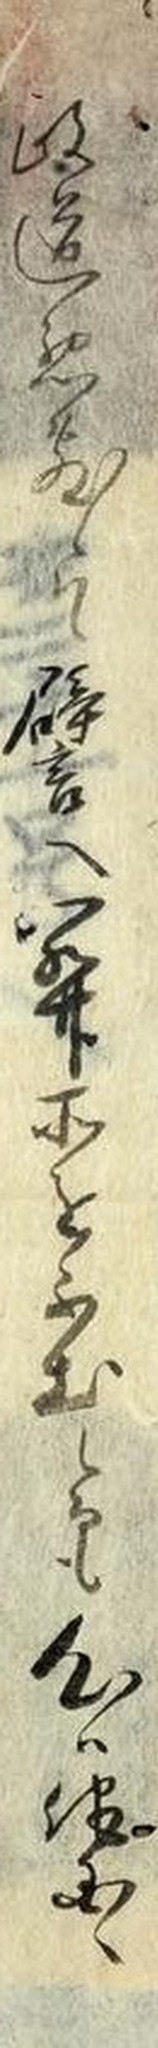政道悪敷候ハヽ譬へ関所を不出候而も心ハ他国へ
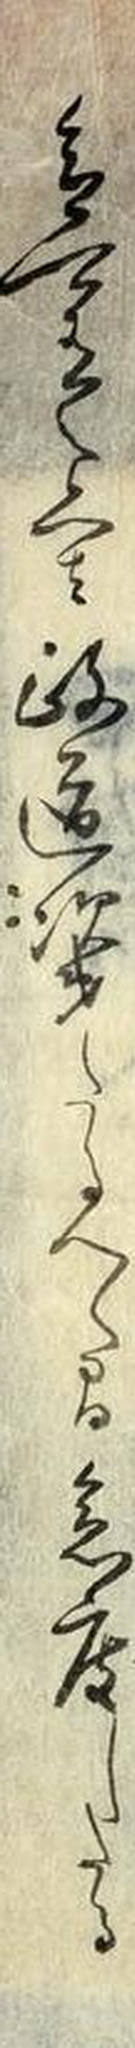参可有之候へ者政道次第たるへく間急度したる
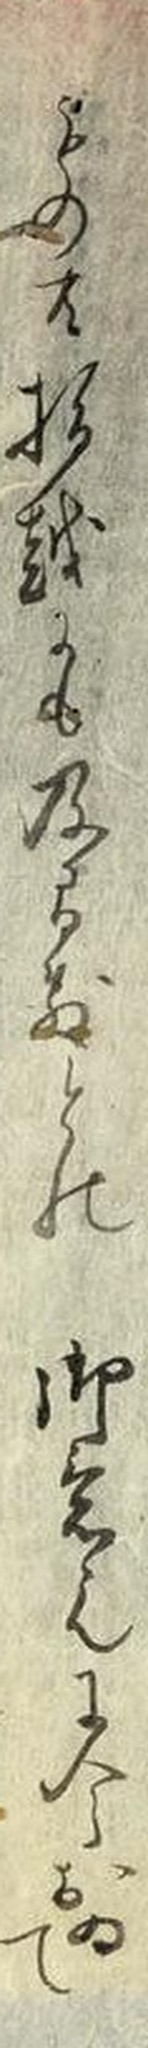もの共指越にも及間敷との御意也爾今おゐて
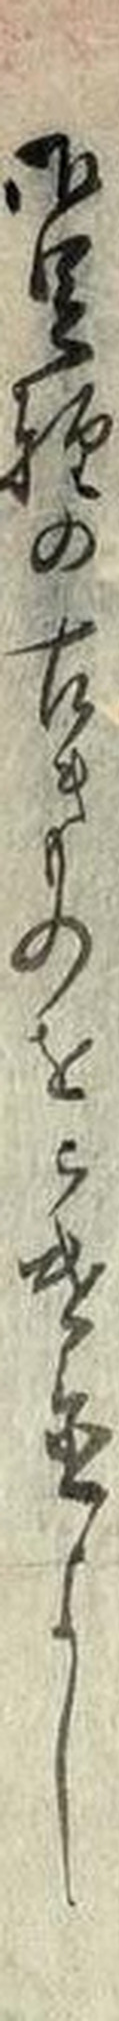御足軽の古きものを被遣置よし
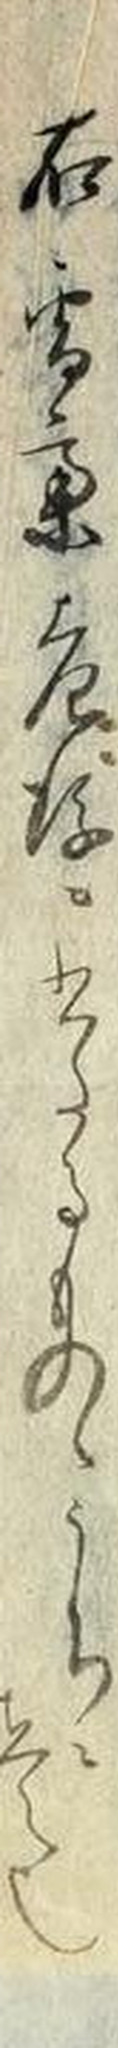右雪後ニ書たるものゝうちニ在之也
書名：少傅日録抄（斉承付側向頭取日記、在府）
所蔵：福井県文書館 Fukui Prefectural Archives
